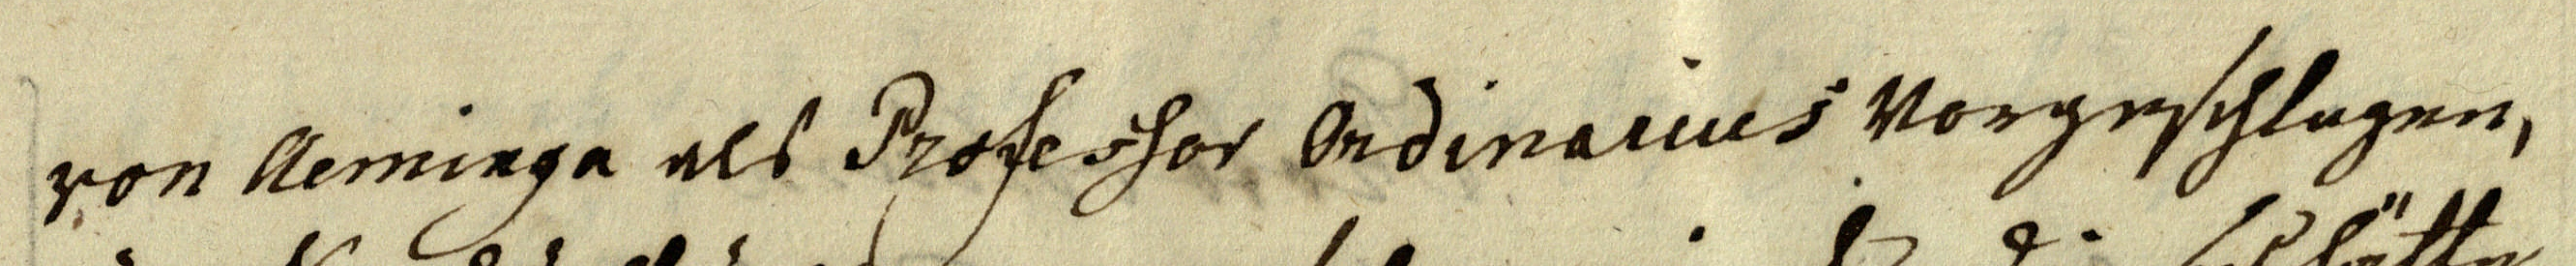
von Aeminga als Professor Ordinarius vorgeschlagen,
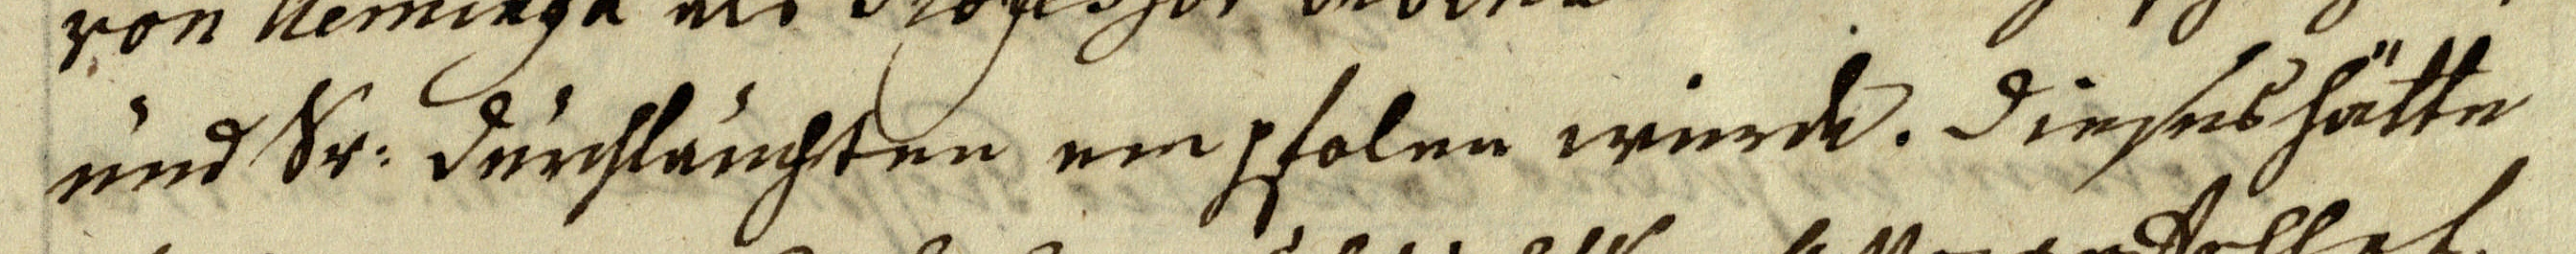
und Sr. Durchlauchten empfolen würde. Dieses hätte
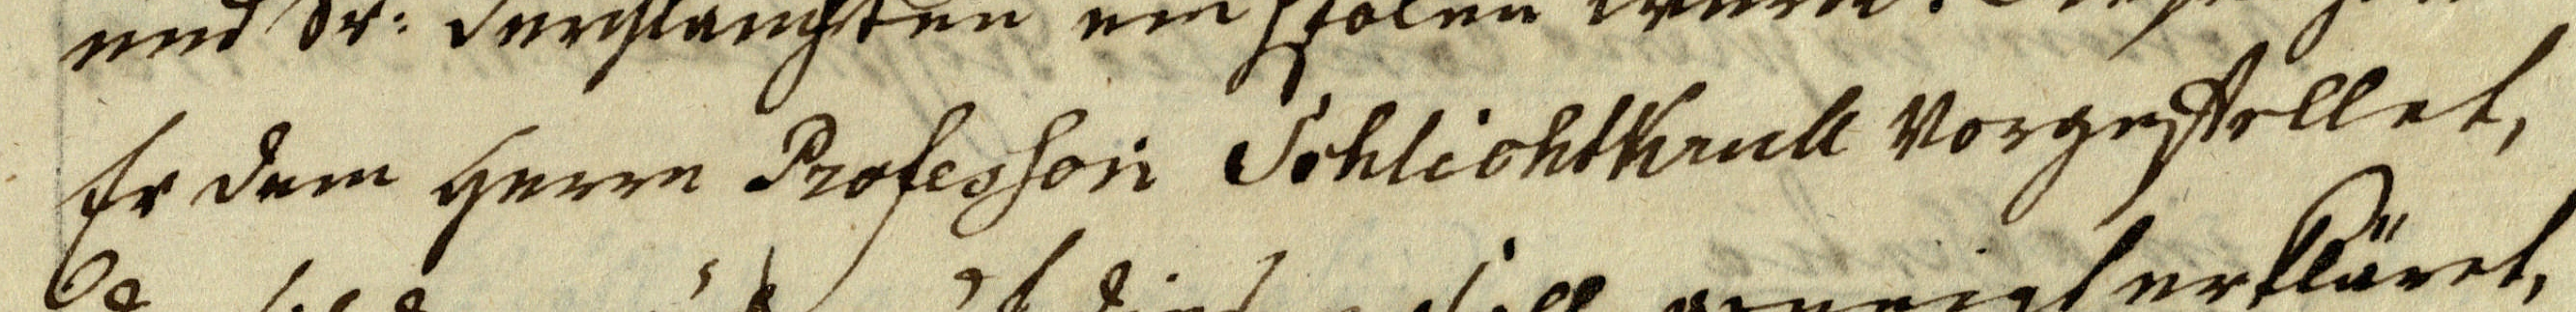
Er demHerrn Professori Schlichtkrull vorgestellet,
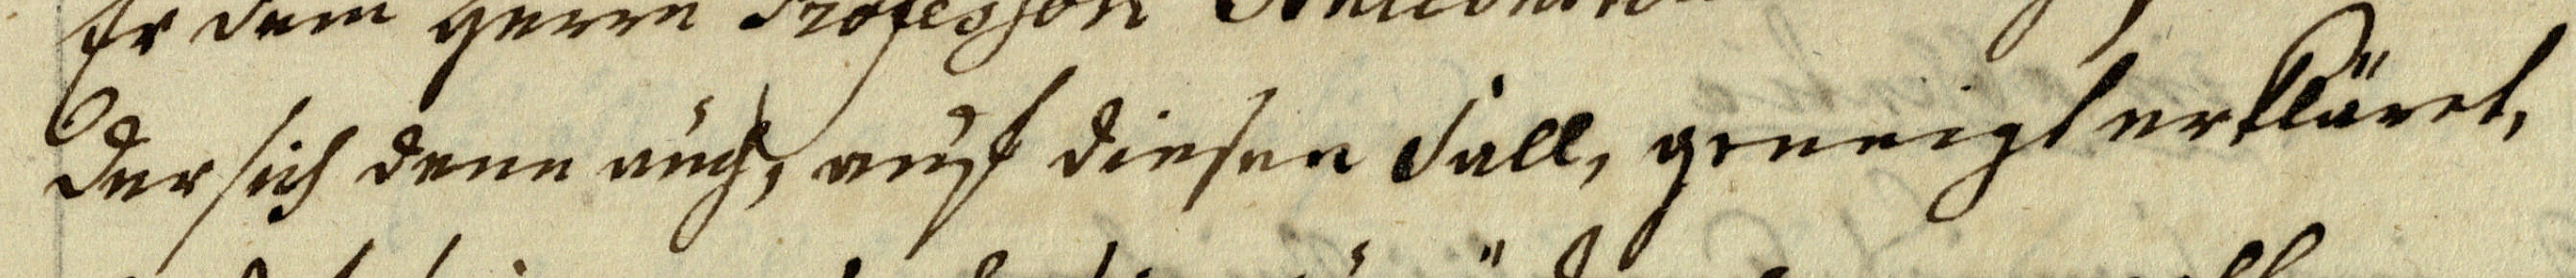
der sich denn auch auf diesen Fall, geneigt erkläret,
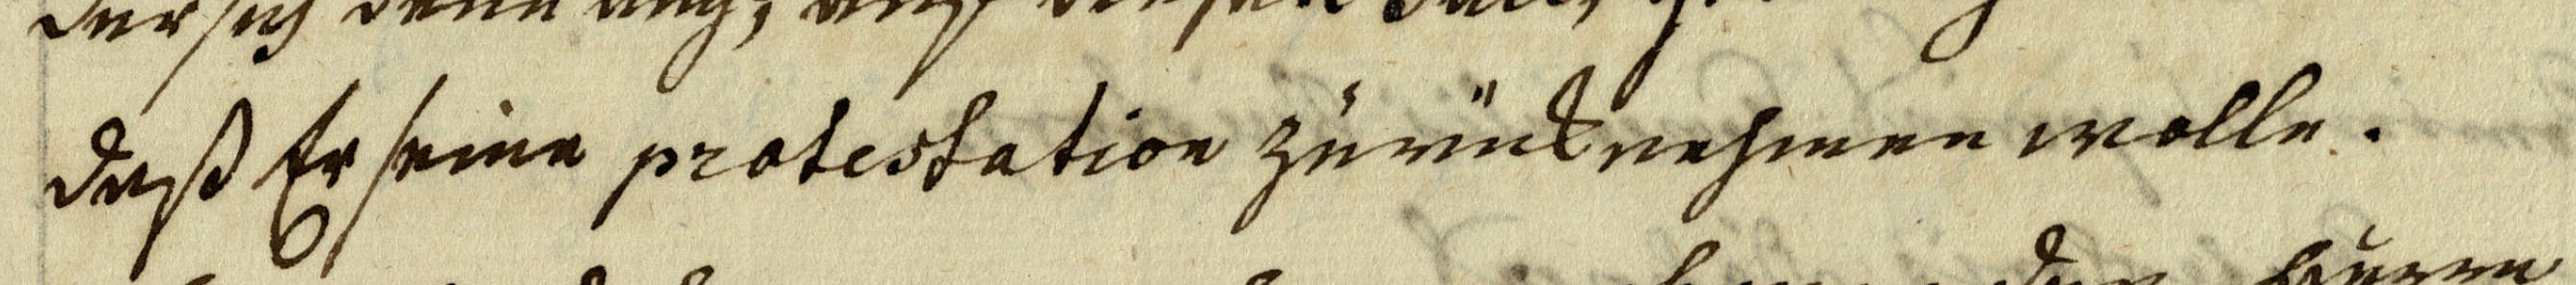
daß Er seine protestation zurücknehmen wolle.
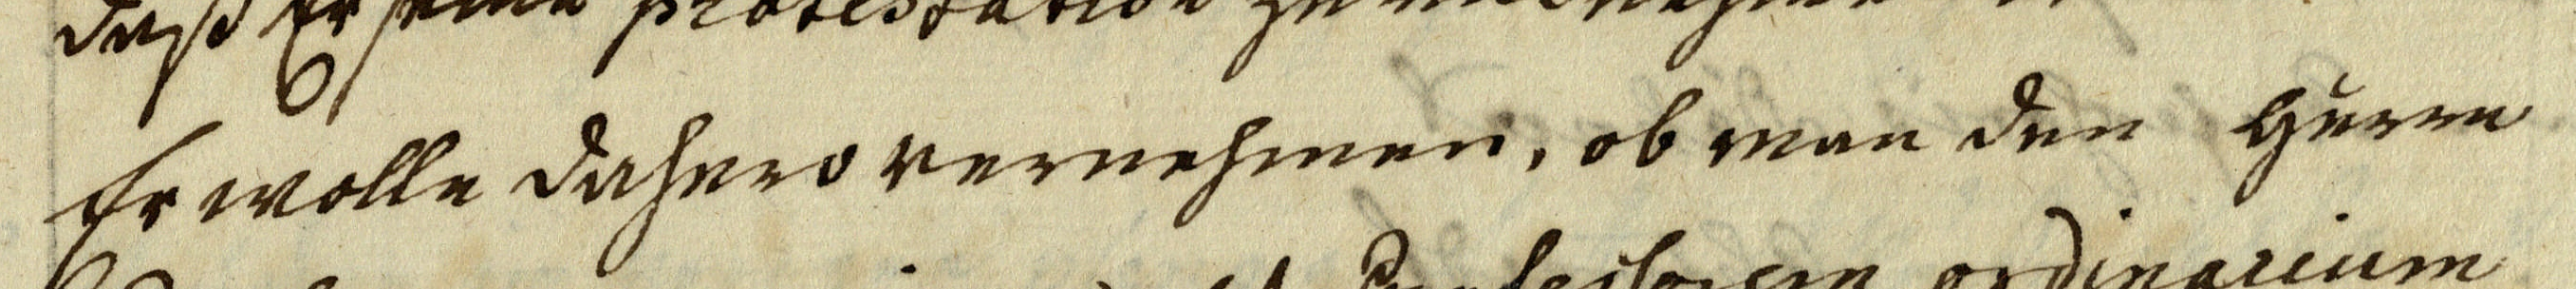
Er wolle dahero vernehmen, ob man den Herrn
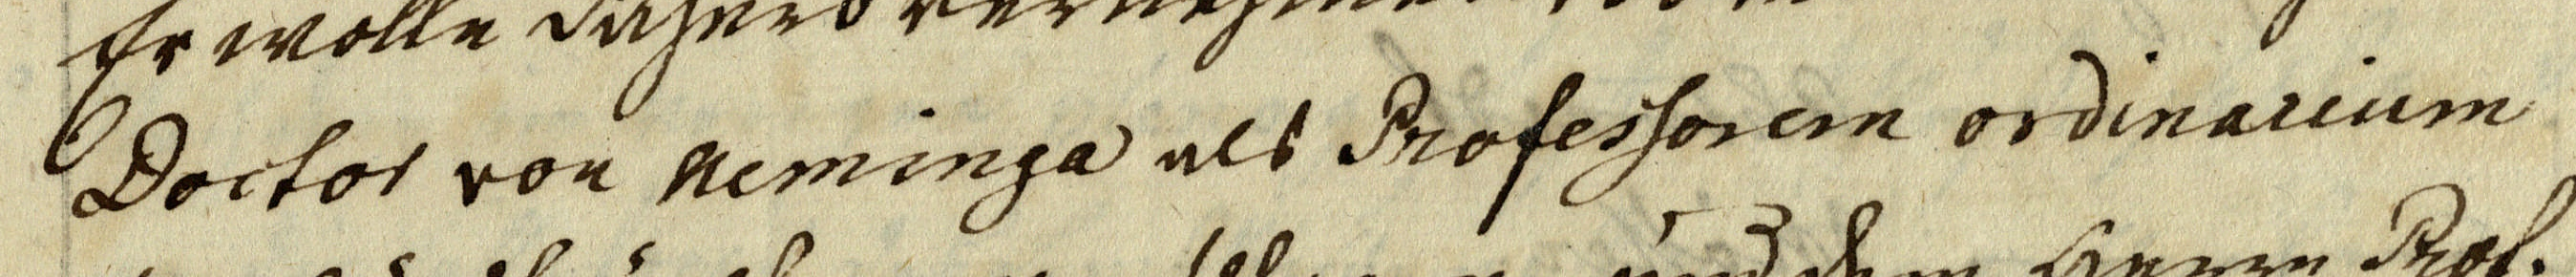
Doctor von Aeminga als Professorem ordinarium
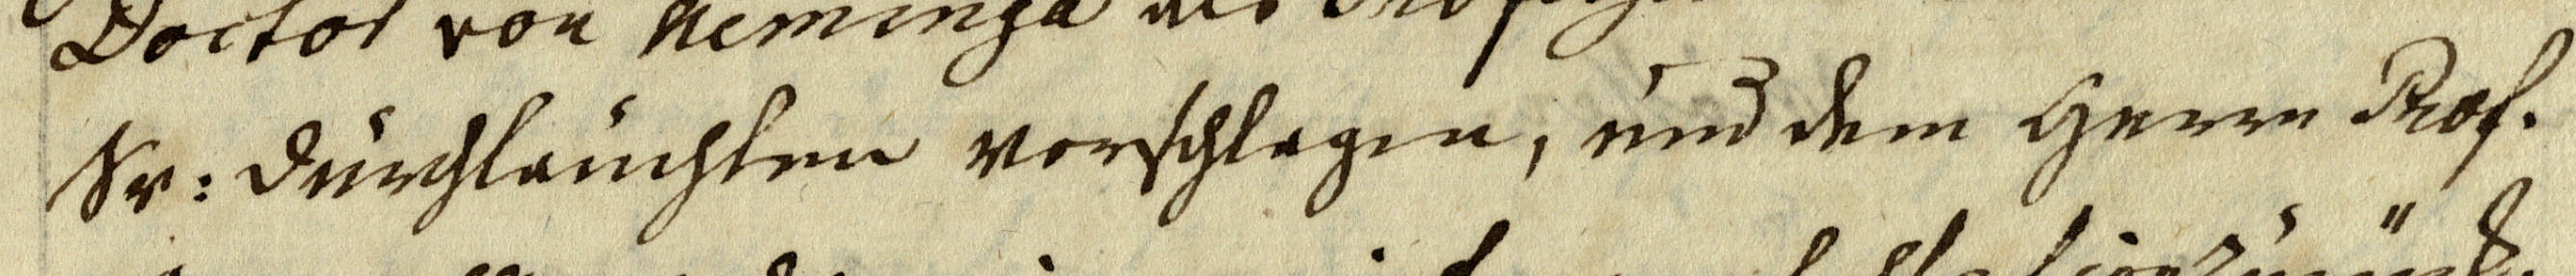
Sr. Durchlauchten vorschlagen, und dem Herrn Prof.
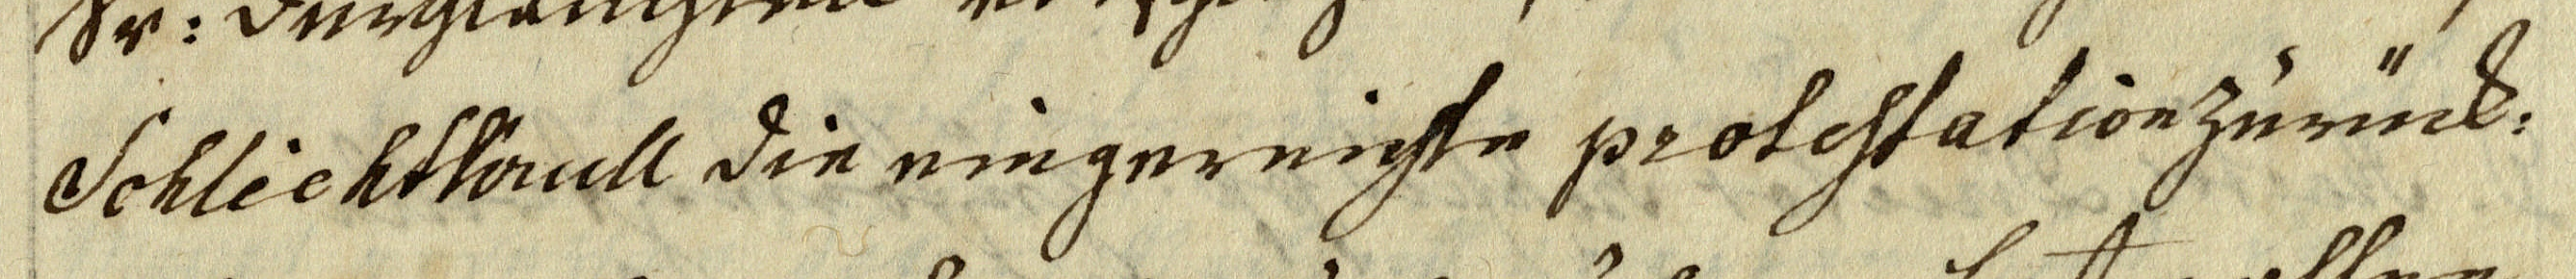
Schlichtkrull die eingereichte protestation zurück¬
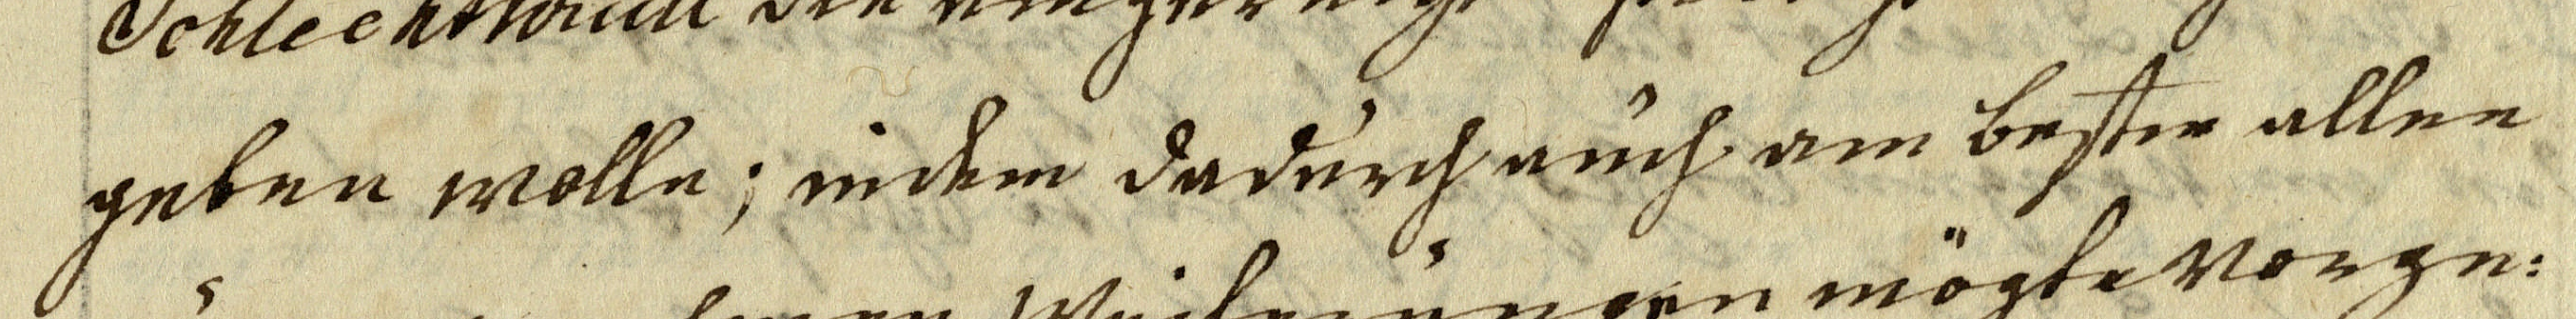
geben wolle; indem dadurch auch am besten allen
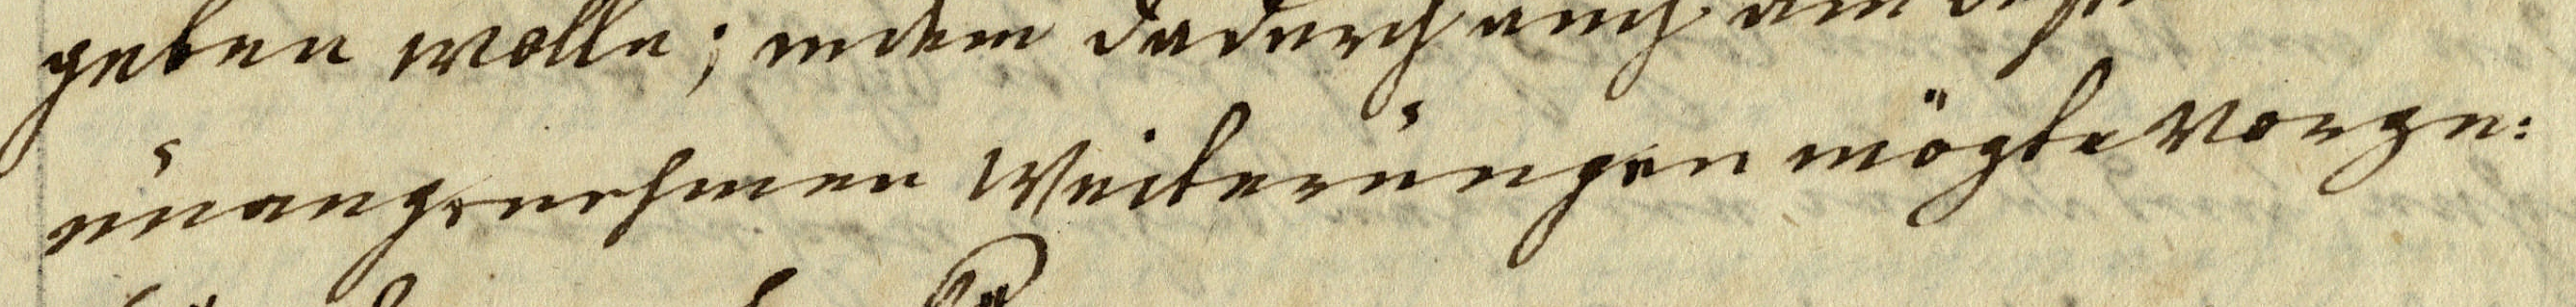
unangenehmen Weiterungen mögte vorge¬
